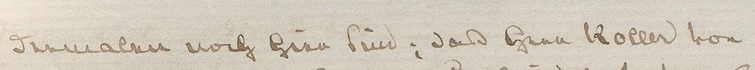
dermalen noch hier sind; daß Herr Koller vor
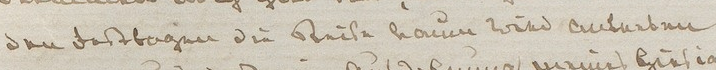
den Festtagen die Reise kaum wird antreten
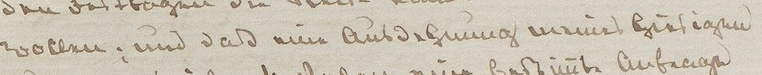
wollen; und daß eine Ausdehnung meines hiesigen
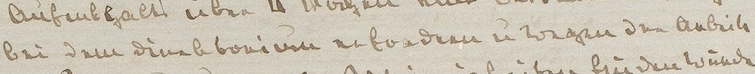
bei dem Direktorium erfordern u wegen der Arbeiten
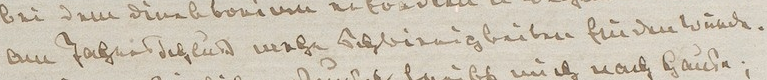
am Jahresschluß mehr Schwierigkeiten finden würde.
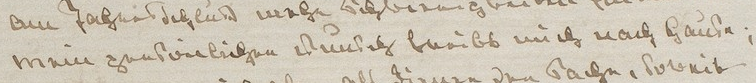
Mein persönlicher Wunsch treibt mich nach Hause;
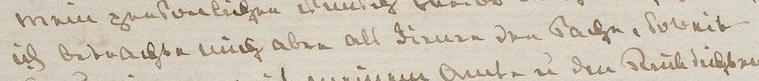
ich betrachte mich aber als Diener der Sache, soweit
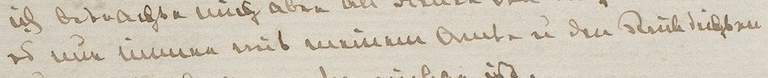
es nur immer mit meinem Amte u den Rücksichten
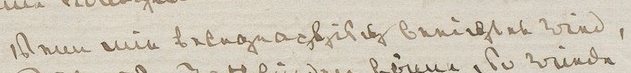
Wenn mir telegraphisch berichtet wird,
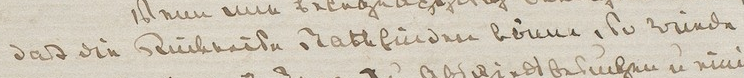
daß die Rückreise stattfinden könne, so würde
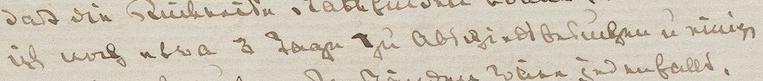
ich noch etwa 3 Tage zu Abschiedsbesuchen u einigen
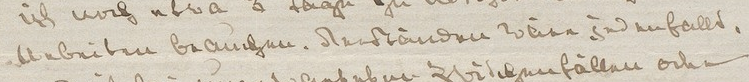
Arbeiten brauchen. Verständen wäre jedenfalls,
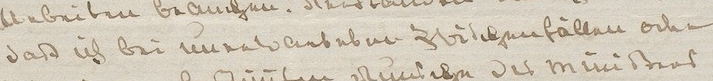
daß ich bei unerwarteten Zwischenfällen oder
